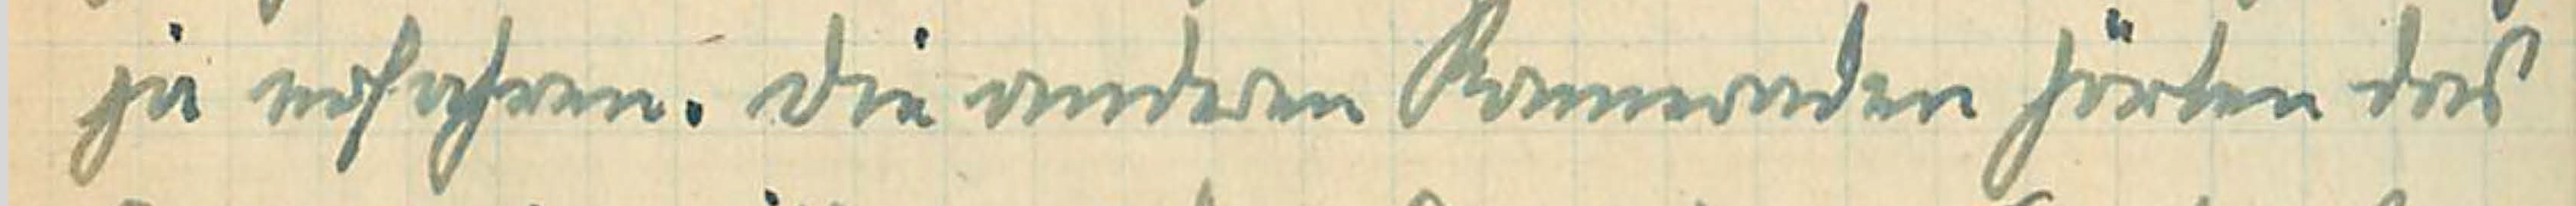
Geschrei u. griffen zu den Gewehren. So etwas war
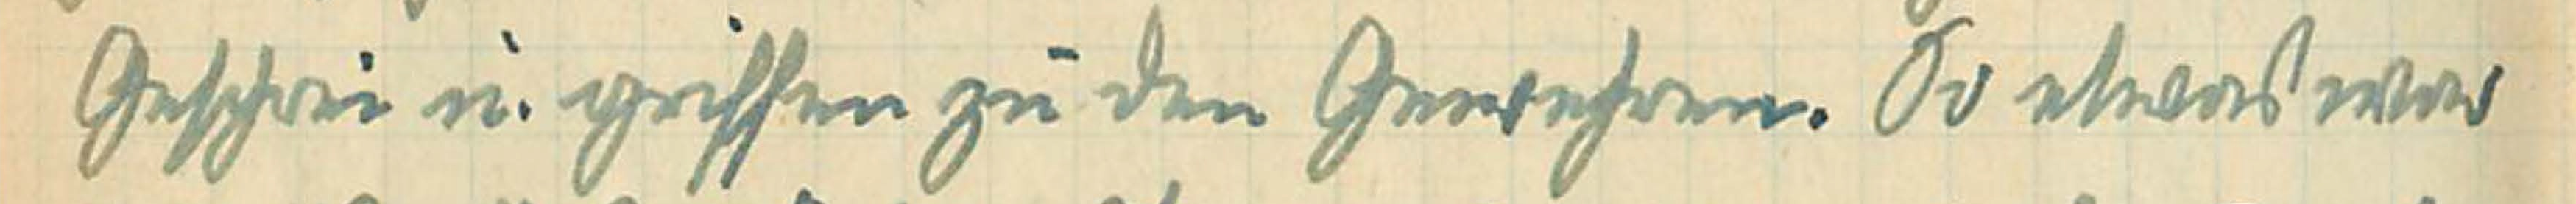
nachts alles möglich. Morgens sahen wir dauernd
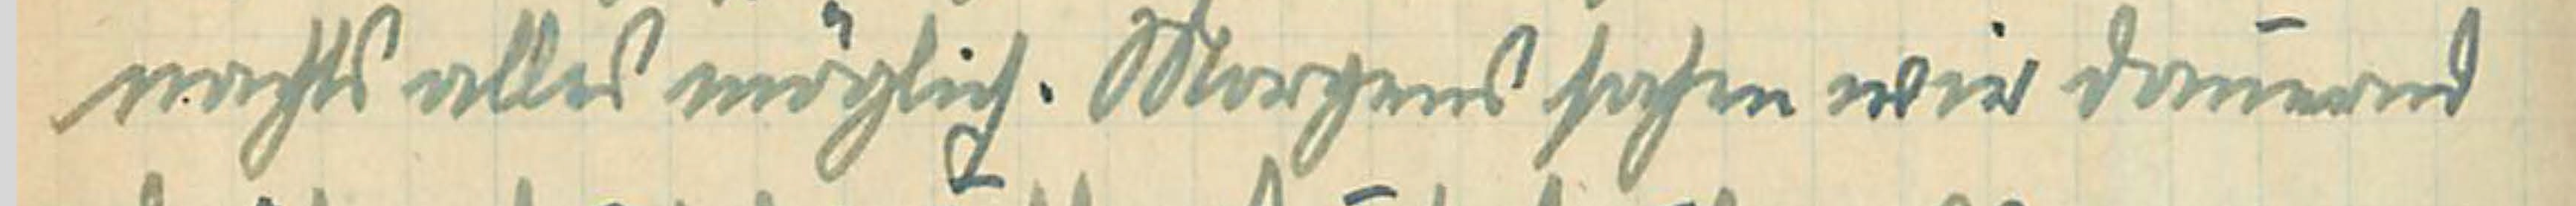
drüben durch die Felder Leute laufen. Es waren
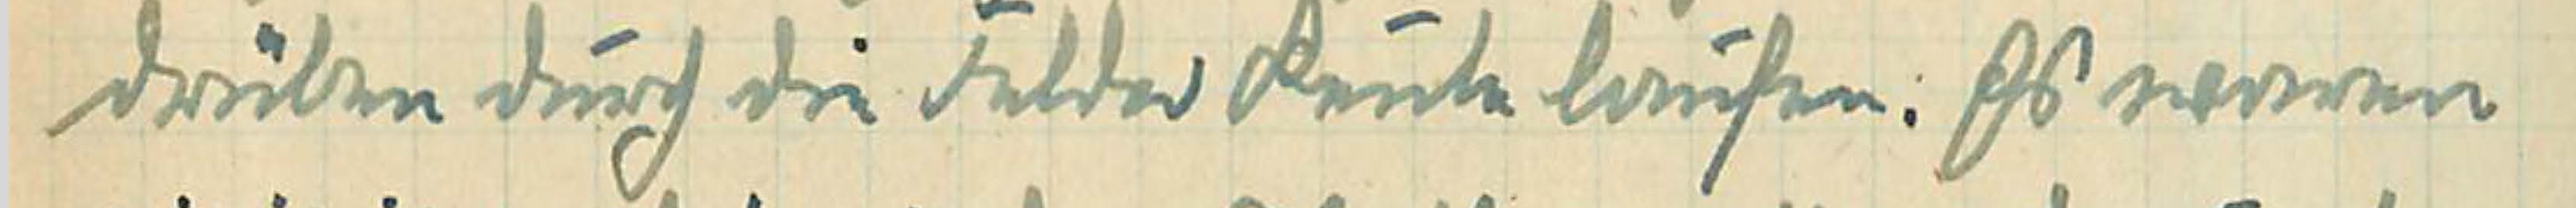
Zivilisten, die in den Wald machten. In unserer
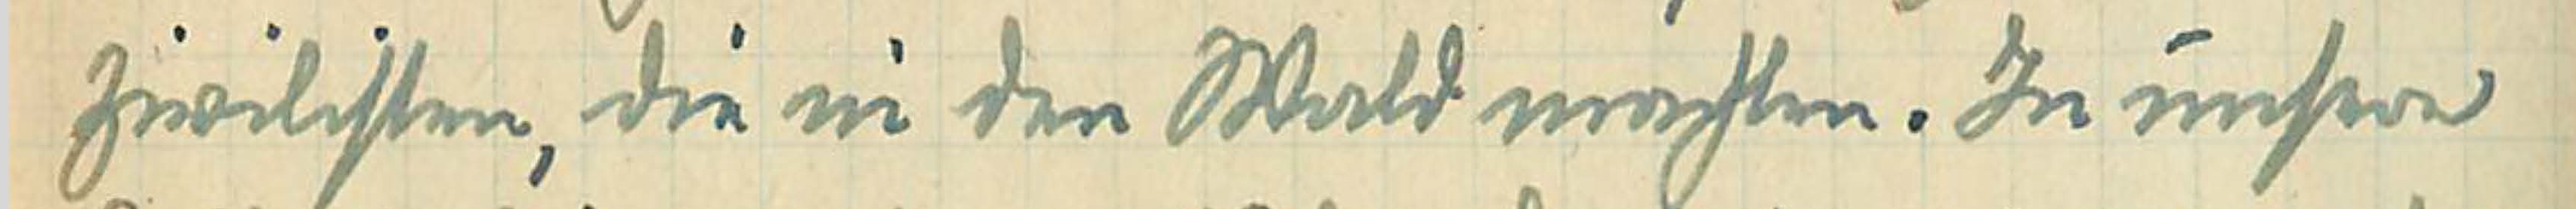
Ortschaft liefen ebenfalls die Bewohner herum. Die
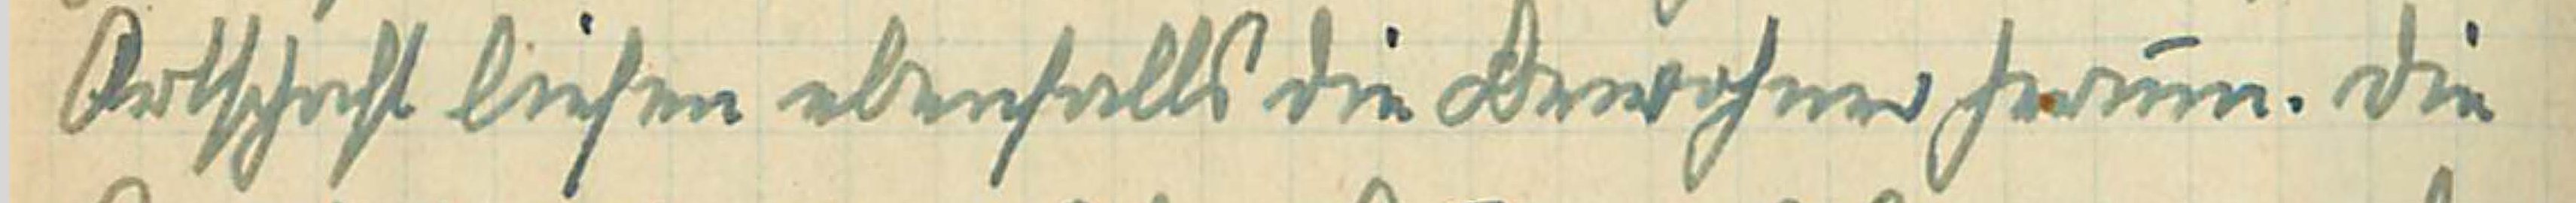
Angst sah ihnen aus den Augen. Wir waren da-
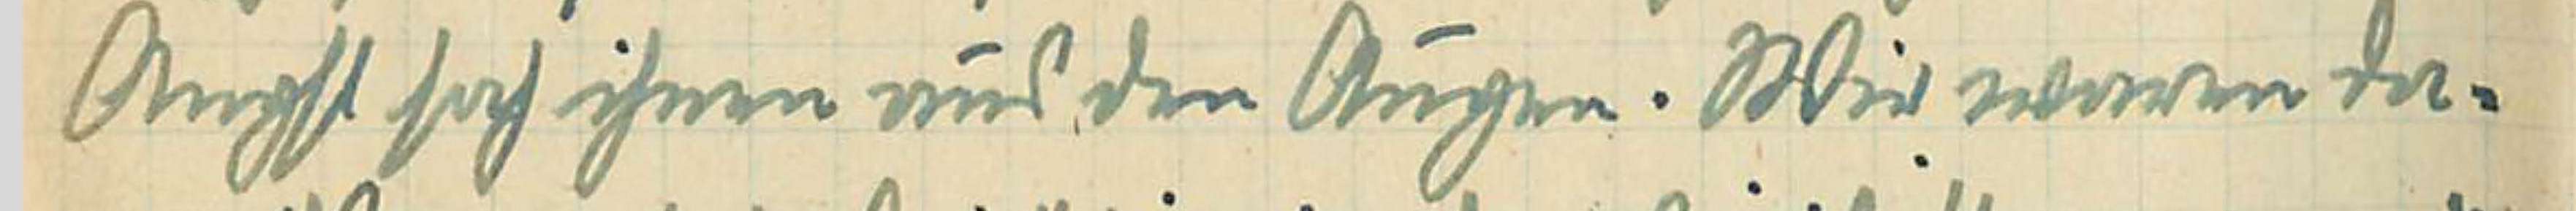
mals noch sehr leichtsinnig den Zivilisten gegenüber.
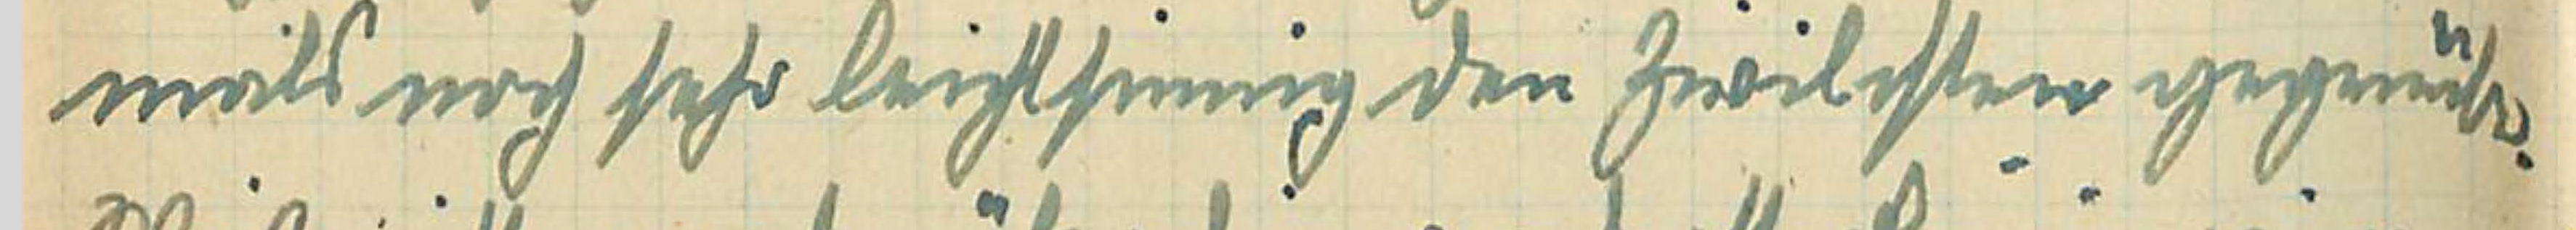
Was nicht gerade über die vorderste Linie ging,
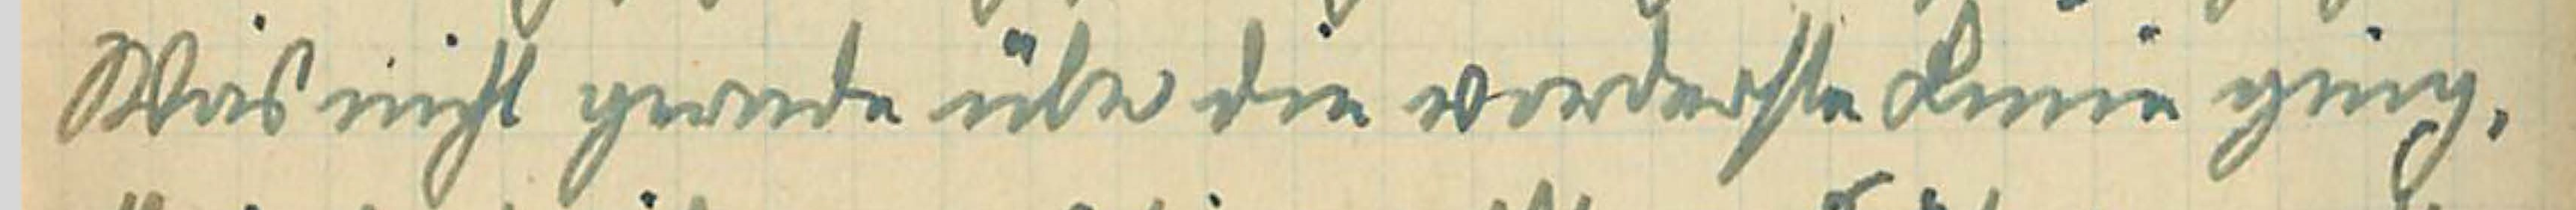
konnte treiben was sie wollten. Später machten
